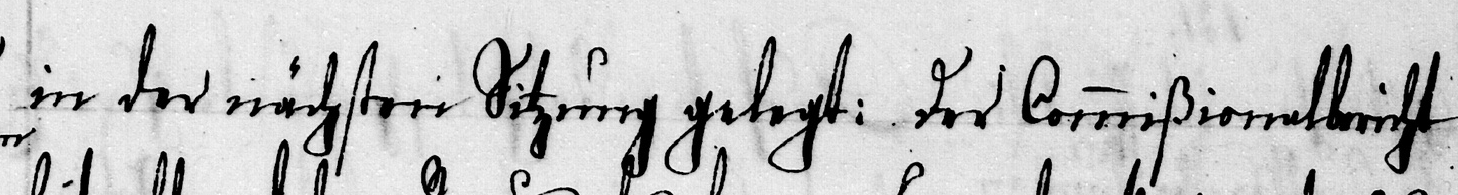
in der nächsten Sitzung gelegt: Der Commißionalbericht
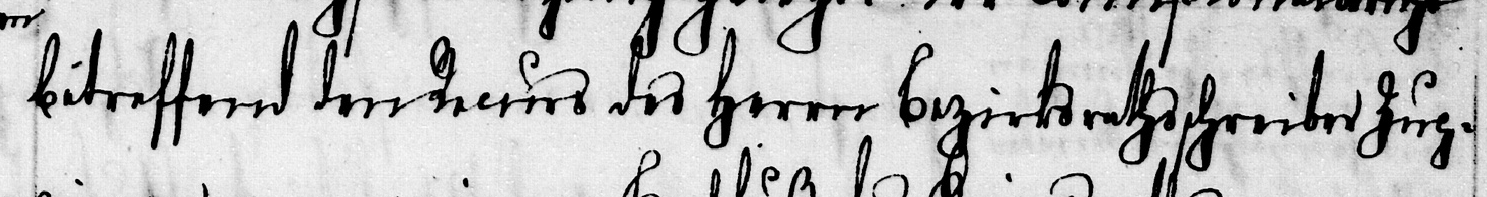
betreffend den Recurs des Herrn Bezirksrathsschreiber Zup¬
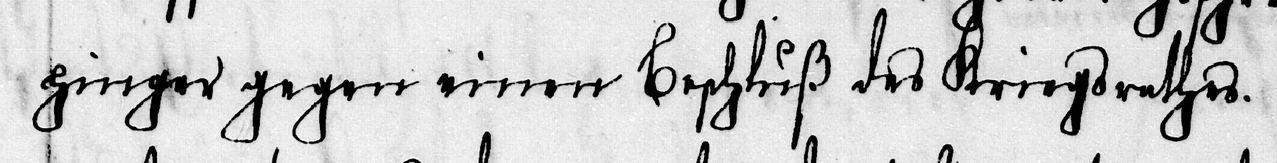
pinger gegen einen Beschluß des Kriegsrathes.
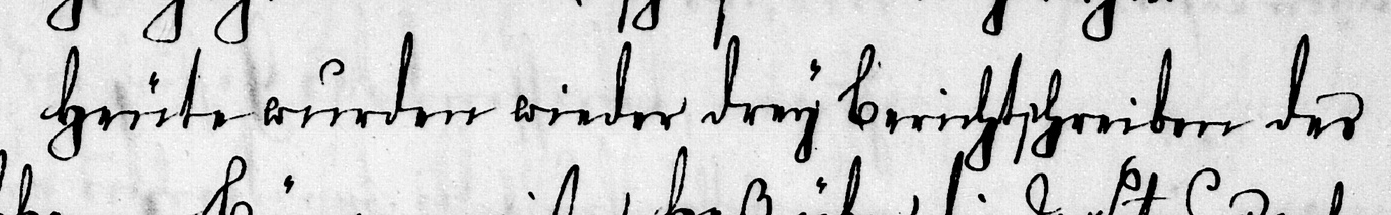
Heute wurden wieder drey Berichtschreiben des
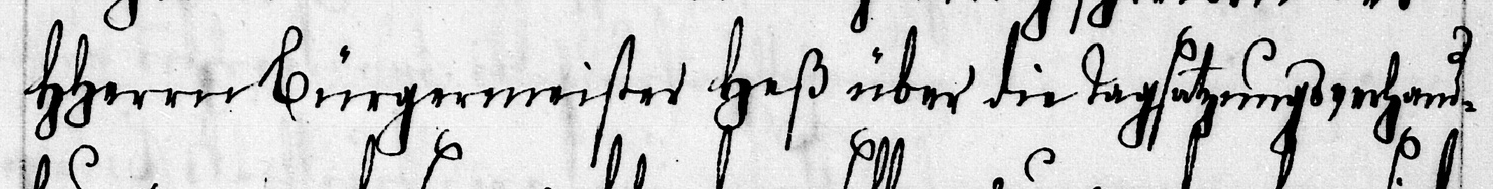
HHerrn Bürgermeister Heß über die Tagsatzungsverhand¬
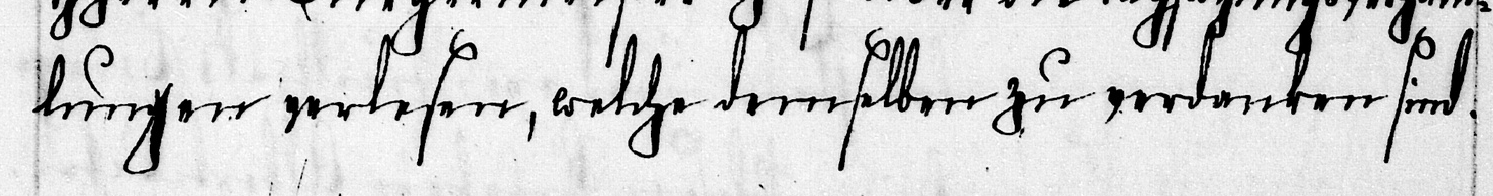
lungen verlesen, welche demselben zu verdanken sind.
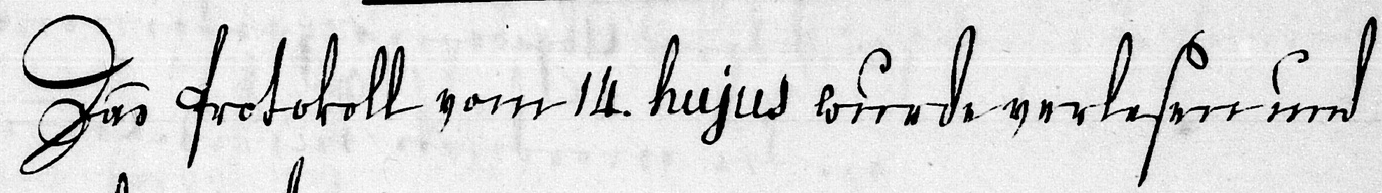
Das Protokoll vom 14. hujus wurde verlesen und
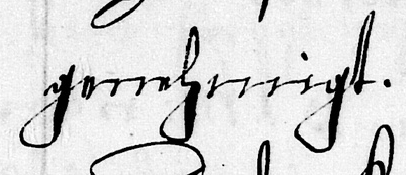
genehmigt.
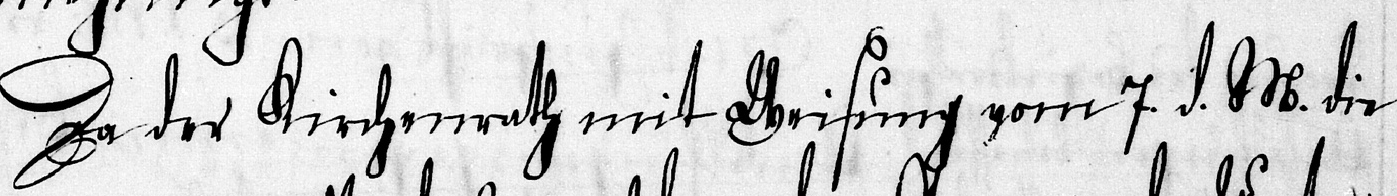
Da der Kirchenrath mit Weisung vom 7. d. M. die
